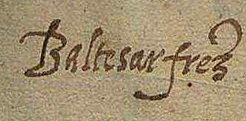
Baltesar frez̄
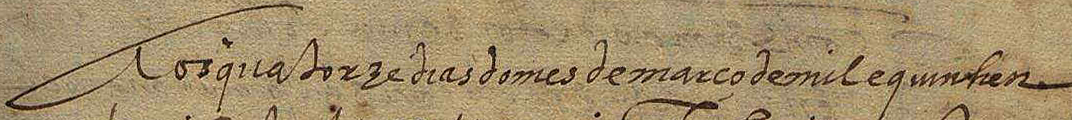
Aos quatorze dias do mes de março de mil e quinhen
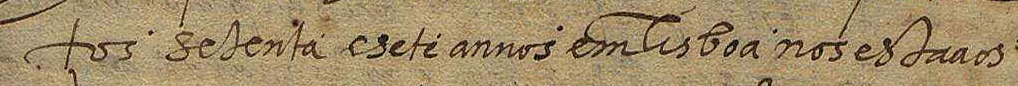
tos setenta e sete annos em lisboa nos estaaos
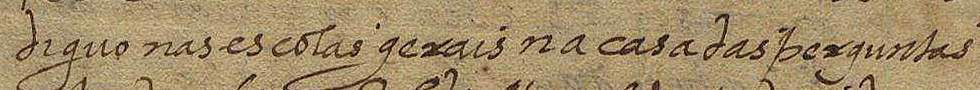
diguo nas escolas gerais na casa das perguntas
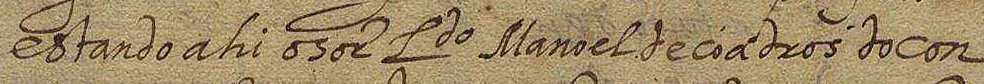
estando ahi o sor̄ Ldo Manoel de coadros do con
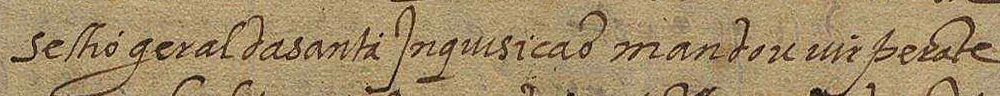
selho geral da santa Jnquisiçaõ mandou uir perāte
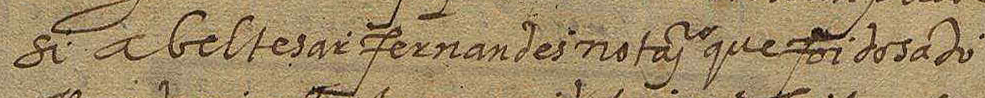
si a beltesar fernandes notajro que foi do sāto
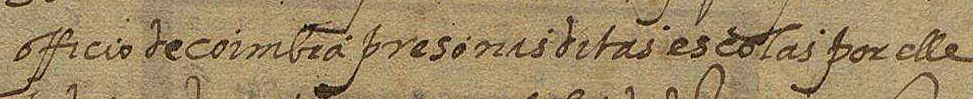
officio de coimbra preso nas ditas escolas por elle
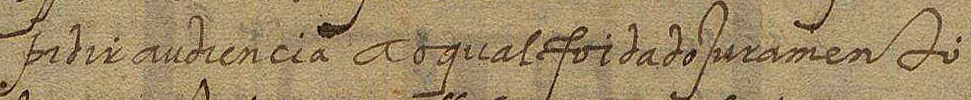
pidir audiencia ao qual foi dado Juramento
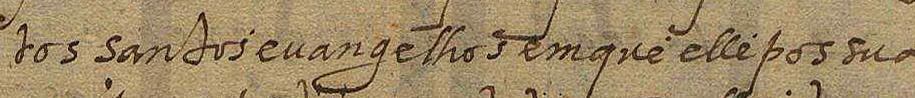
dos santos euangelhos em que elle pos sua
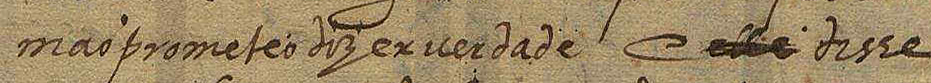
maõ prometeo dizer uerdade e elle disse
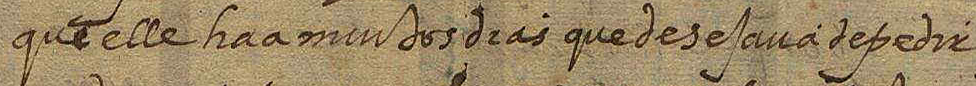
que elle haa muitos dias que deseJaua de pedir
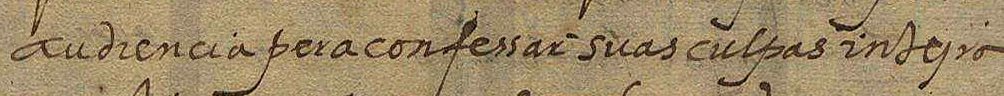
audiencia pera confessar suas culpas intejra
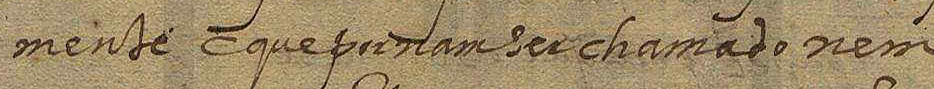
mente e que por nam ser chamado nem
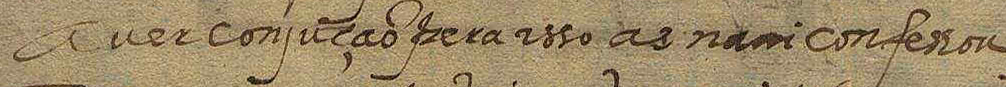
auer conjuçaõ pera isso as nam confessou
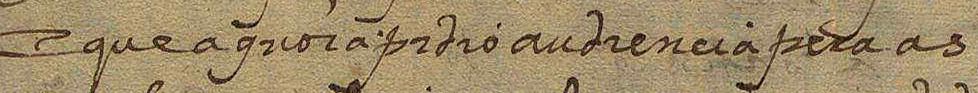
e que aguora pidio audiencia pera as
